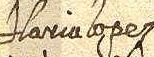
Maria lopez
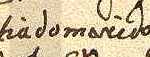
tia do marido
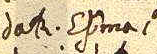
da R. E p̄ma 1a
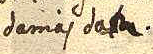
da maj da R.
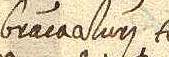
brāca alur̄z
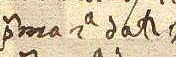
p̄ma 2a da R
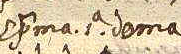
E p̄ma. 1a. do mar
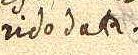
rido da R.
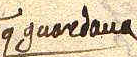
q̄ guardaua
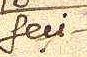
feçi
